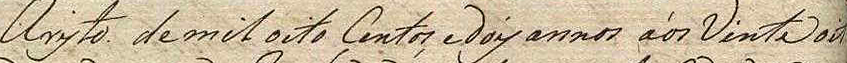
Christo de mil oitoCentos, e dois annos áos Vinte oi
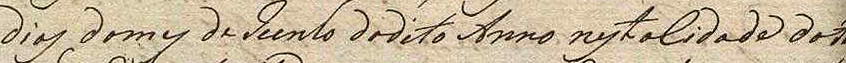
dias do mes de Iunho do dito Anno nesta Cidade do
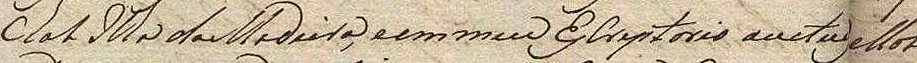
chal Ilha da Madeira, e em meu EsCriptorio auctu
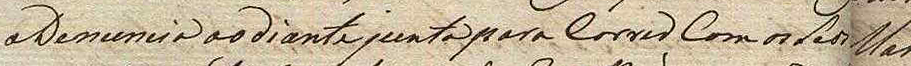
a Denuncia aodiante junta para Correr Com os seos
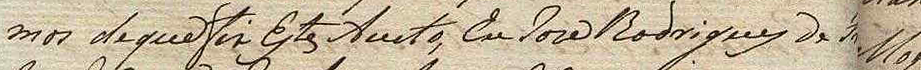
mos de que fiz Este Aucto, Eu Ioze Rodrigues do
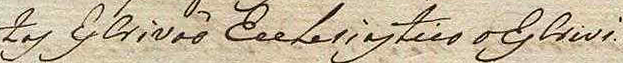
tas EsCrivaõ Ecclesiastico o EsCrivi.
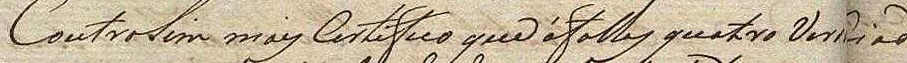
E outroSim mais Certifico que á folhas quatro Vers
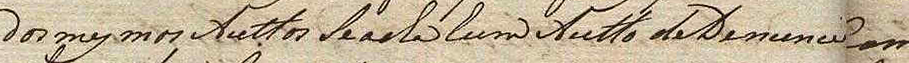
dos mesmo Auttos Se acha hum Autto de Denunci
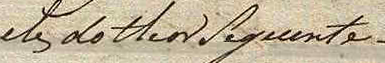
ele do theor Seguinte
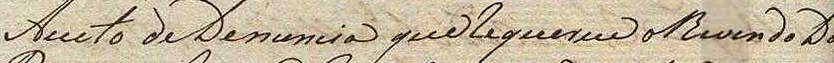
Aucto de Denuncia que Requereu o Revendo Do
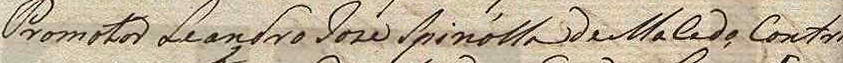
Promotor Leandro Ioze Spinolla de MaCedo, Contra
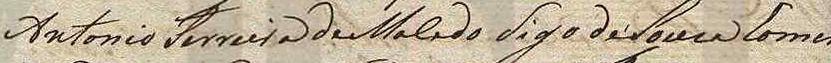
Antonio Ferreira de MaCedo digo de Souza homem
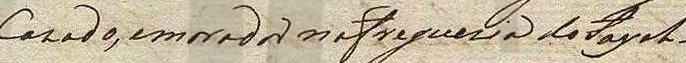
Cazado, e morador na freguezia do Fayal
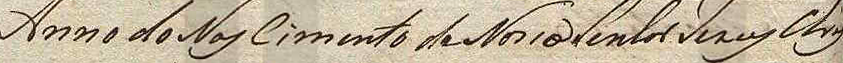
Anno do NasCimento de Nosso Senhor Iezus Chris
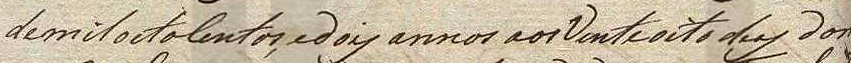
de mil oitoCentos, e dois annos aos Vinte oito dias do
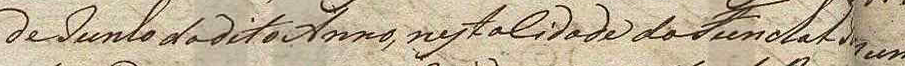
de Iunho do dito Anno, nesta Cidade do Funchal
